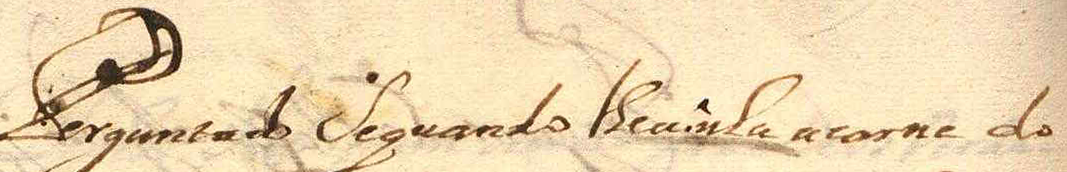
Perguntado Se quando lhe uinha a carne do
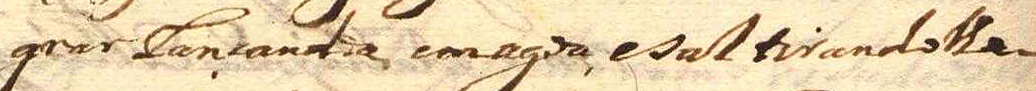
grar Lançandoa em agoa, e sal tirandolhe
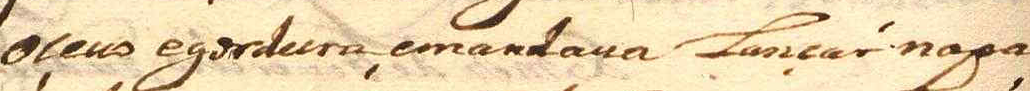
o çeuo e gordura, e mandaua Lançar na pa
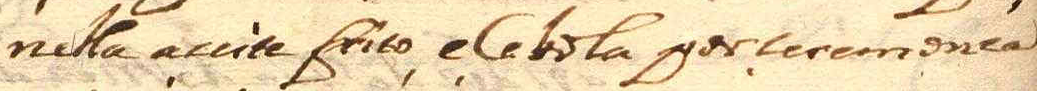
nella açeite frito, e Çebola por ceremonia
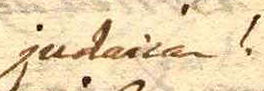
judaica?
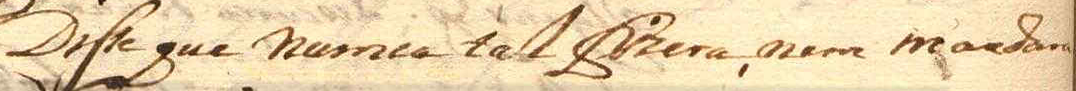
Disse que numca tal fizera, nem mandara
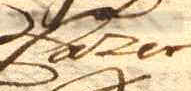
fazer
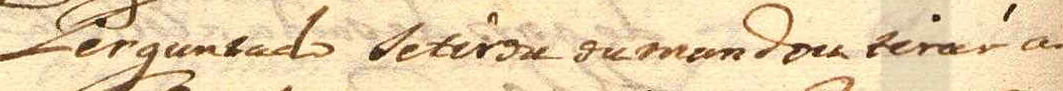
Perguntado se tirou ou mandou tirar a
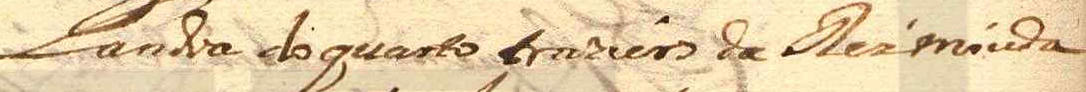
Landoa do quarto trazeiro da Rez miuda
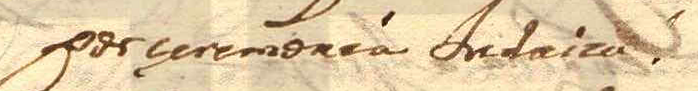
por çeremonia Iudaica?
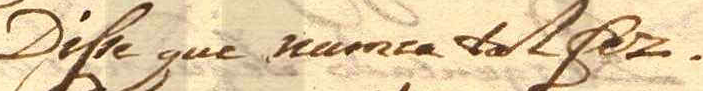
Disse que numca tal fez.
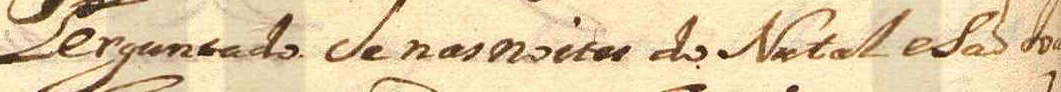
Perguntado Se nas noites do Natal e Saõ Io
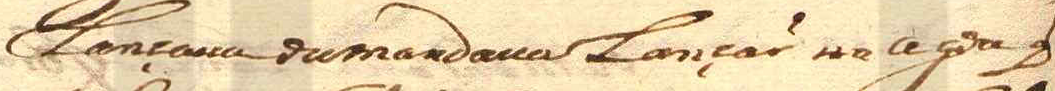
Lançaua ou mandaua Lançar na agoa q̄
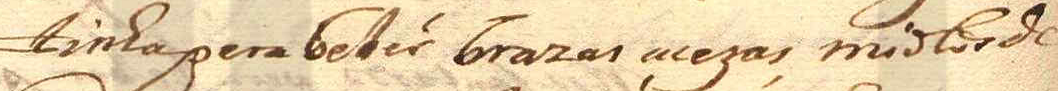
tinha pera beber brazas açezas, miolos de
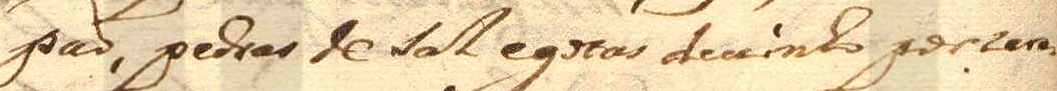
paõ, pedras de sal e gotas de uinho por cere
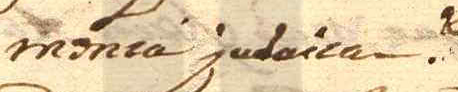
monia judaica?
